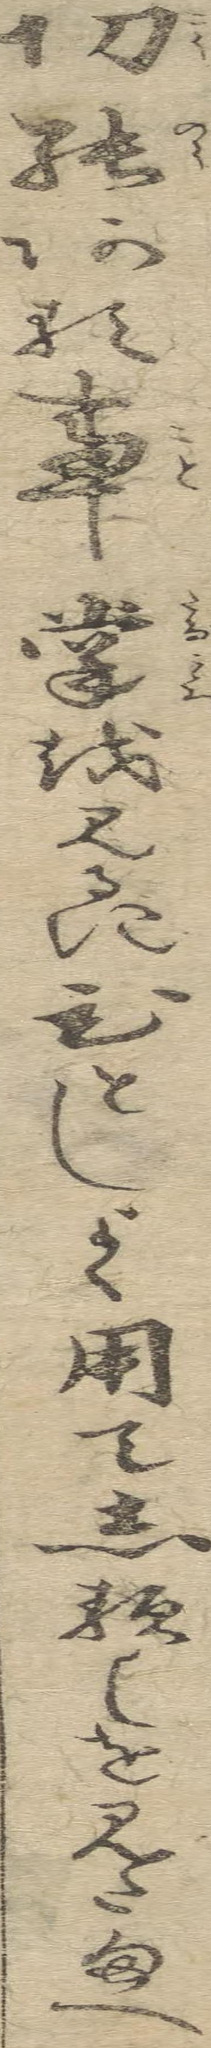功能ある事掌を見るにひとしよく用てしるしを見たまへ
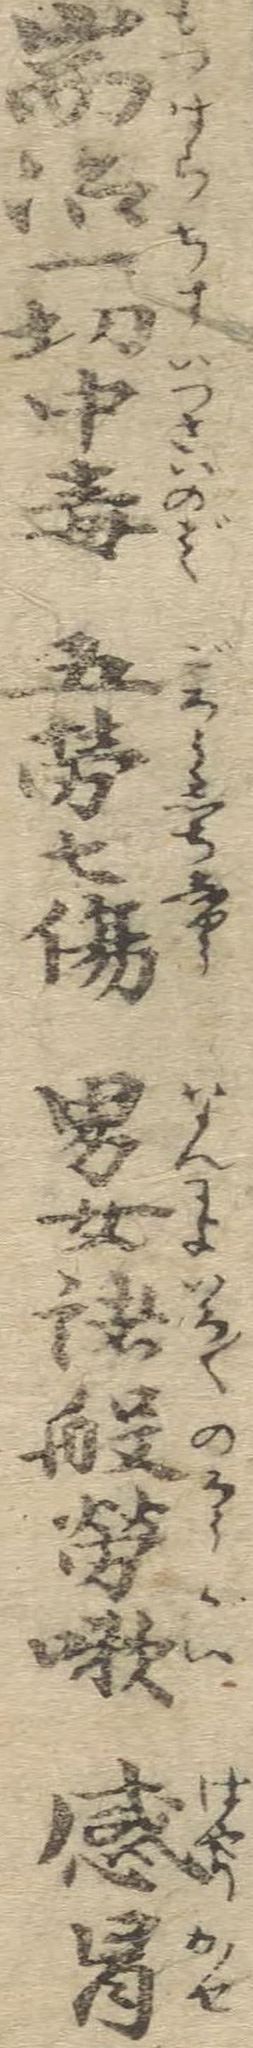耑治一切中毒五労七傷男女諸般労咳感冒
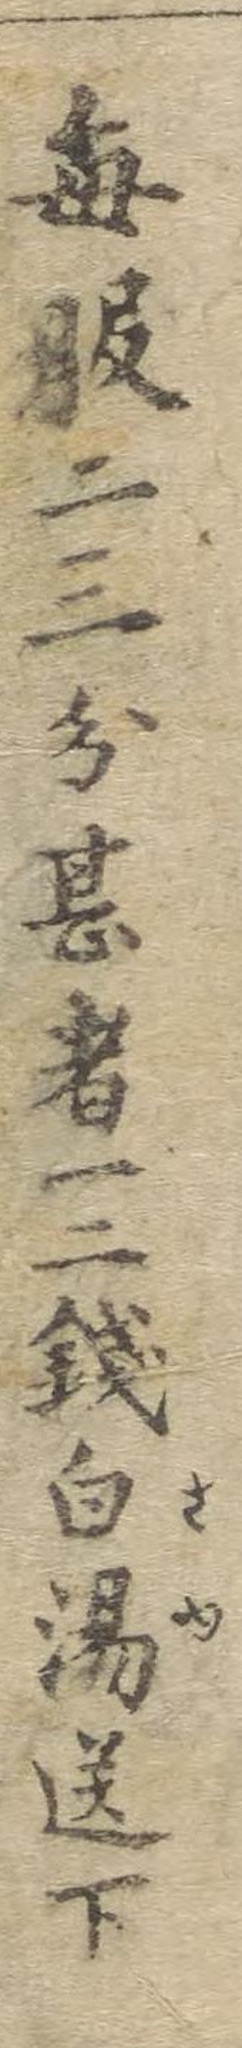毎服二三分甚者一二銭白湯送下
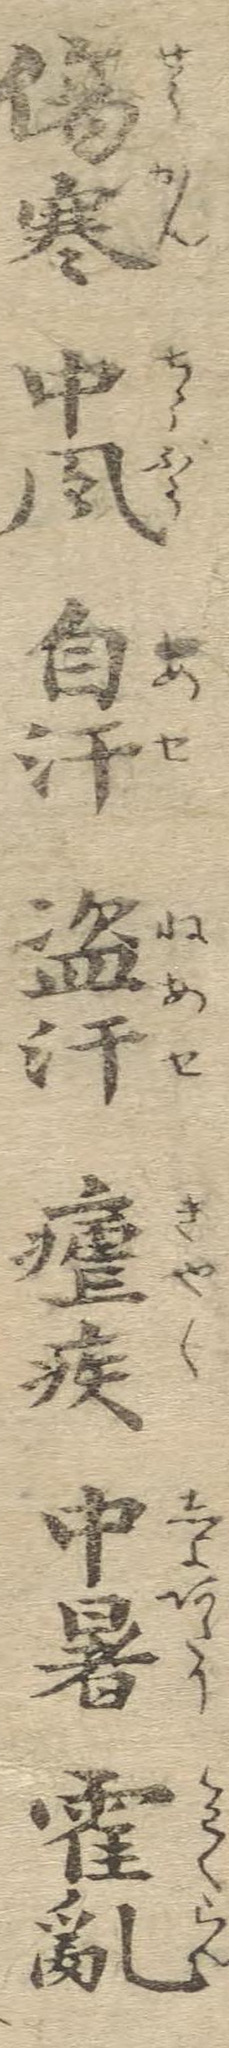傷寒中風自汗盗汗瘧疾中暑霍乱
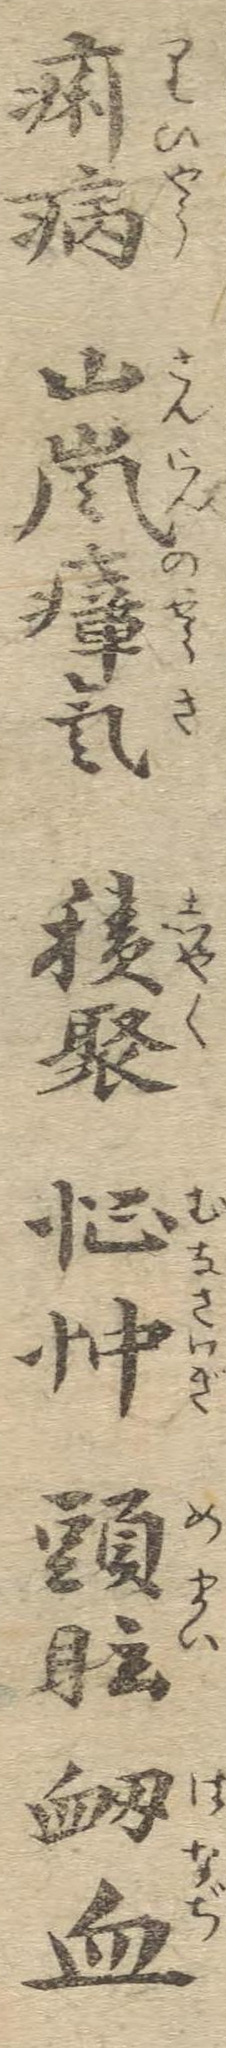痢病山嵐瘒気積聚怔忡頭眩衂血
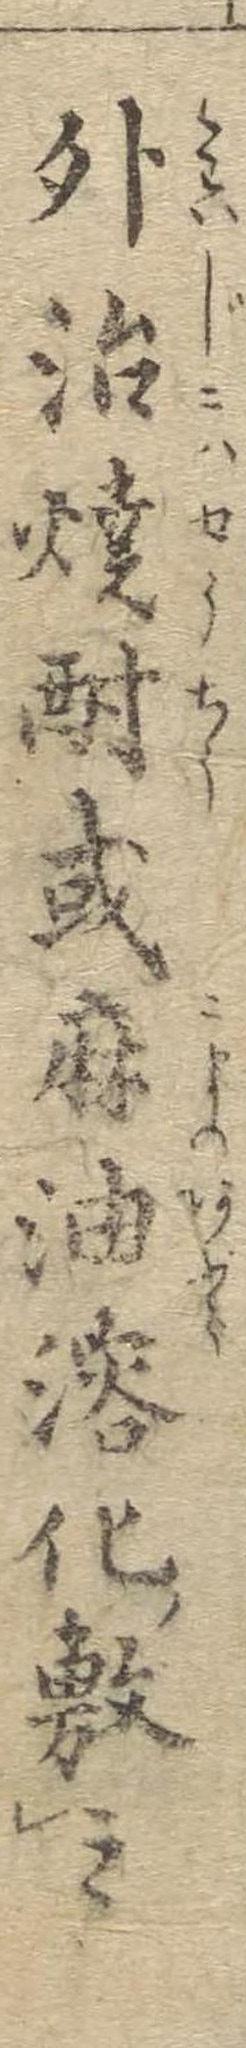外治焼酎或麻油溶化敷之
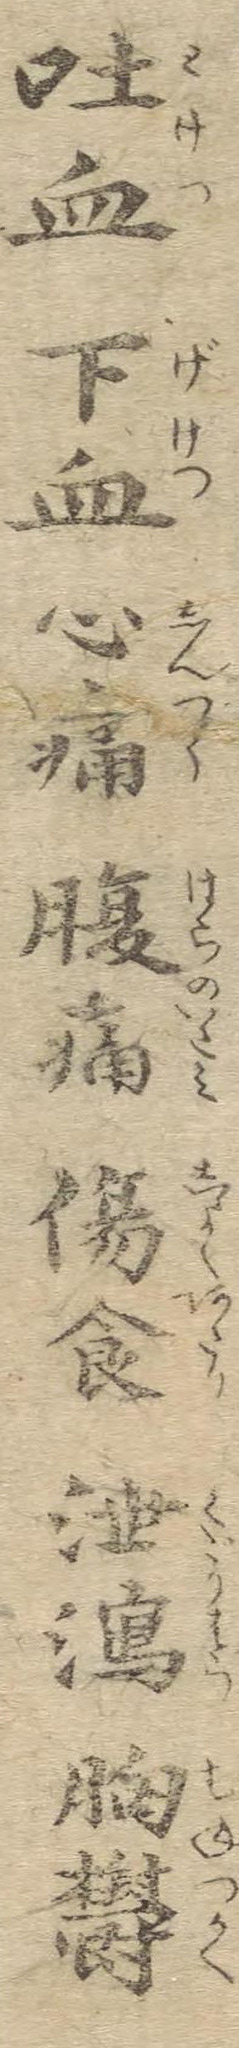吐血下血心痛腹痛傷食泄瀉胸鬱
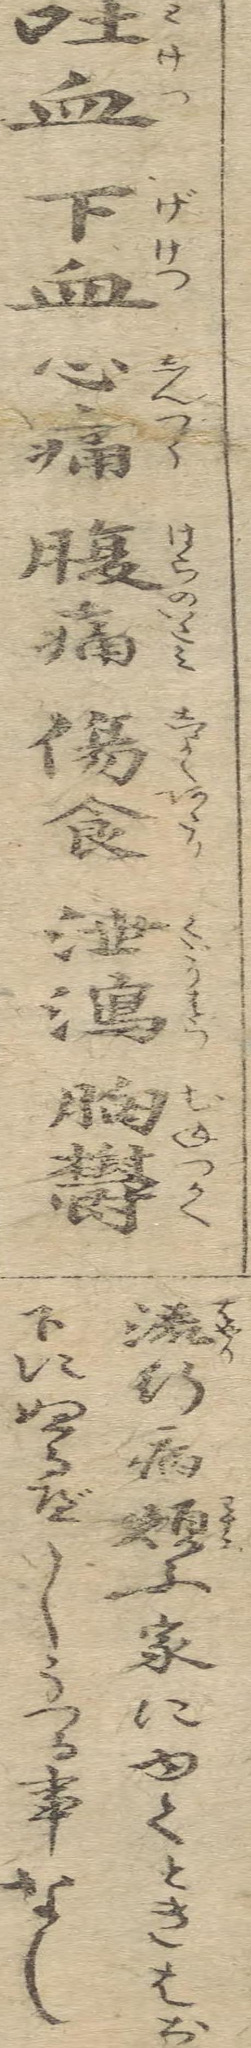吐血下血心痛腹痛傷食泄瀉胸鬱
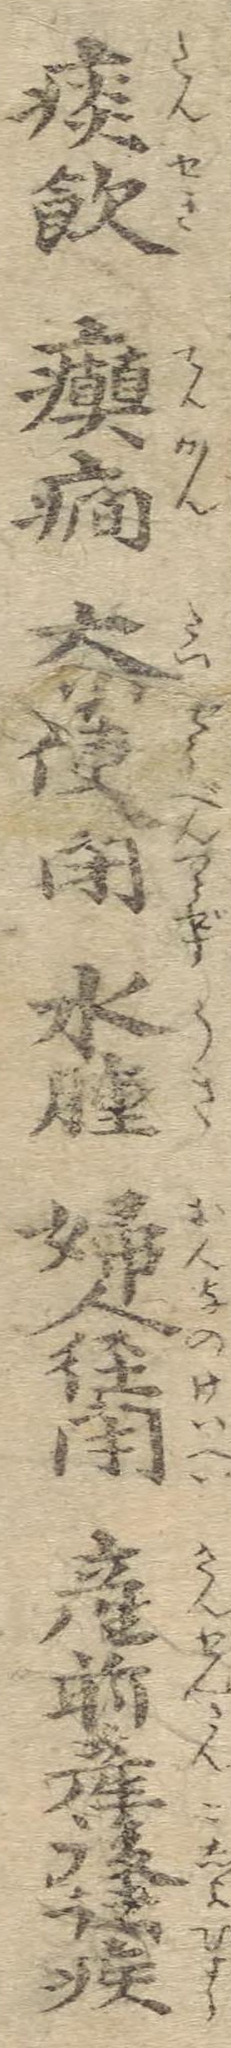痰飲癲癇大小便閉水腫婦人径閉産前産後諸疾
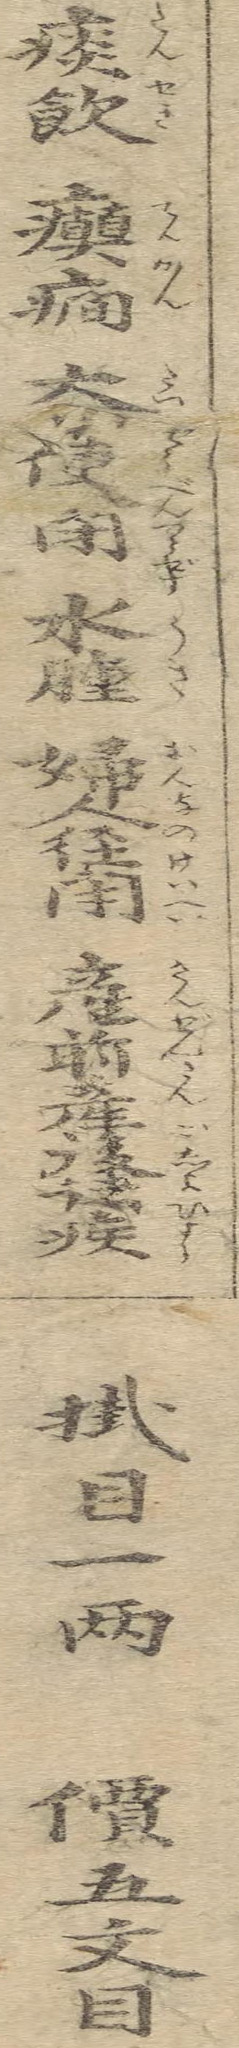痰飲癲癇大小便閉水腫婦人径閉産前産後諸疾
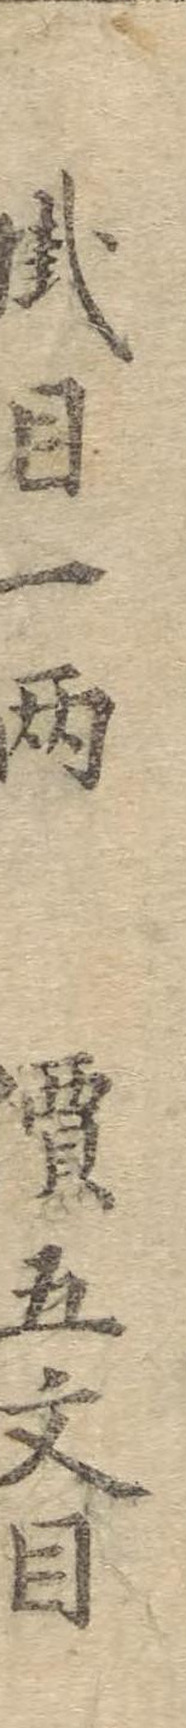掛目一両價五文目
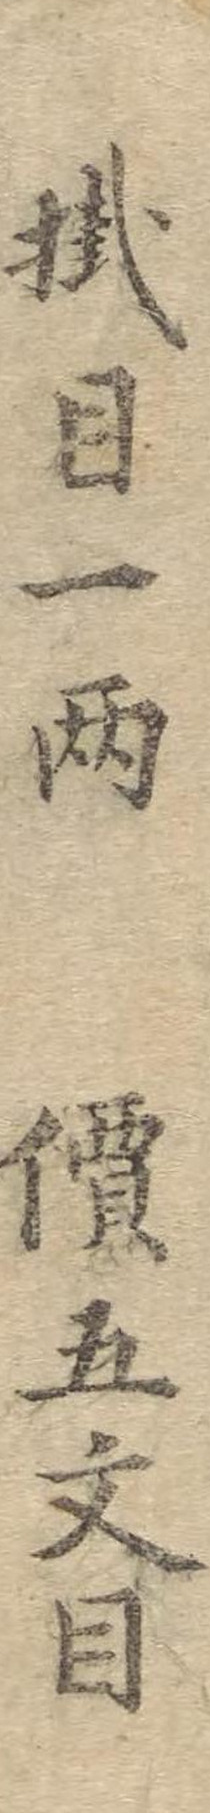掛目一両價五文目
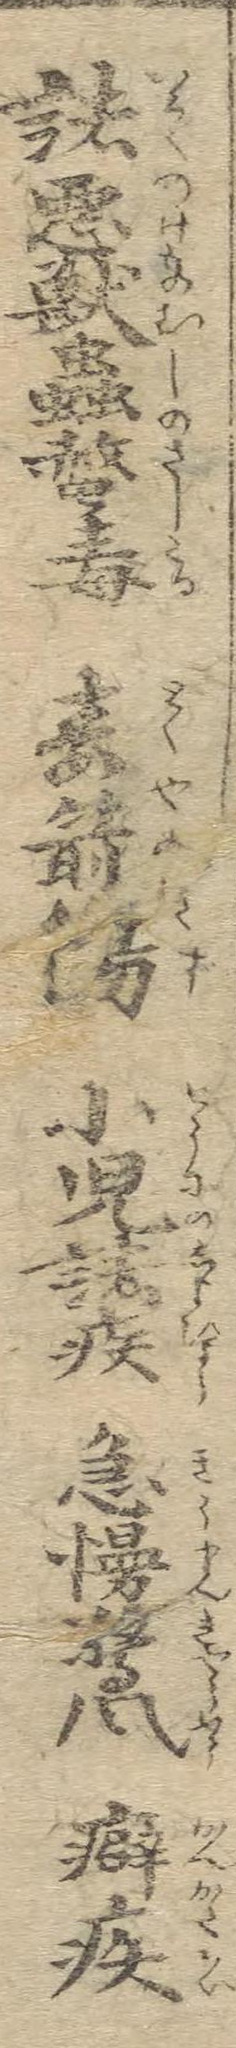諸悪獣虫螫毒毒箭傷小児諸疾急慢驚風癖疾
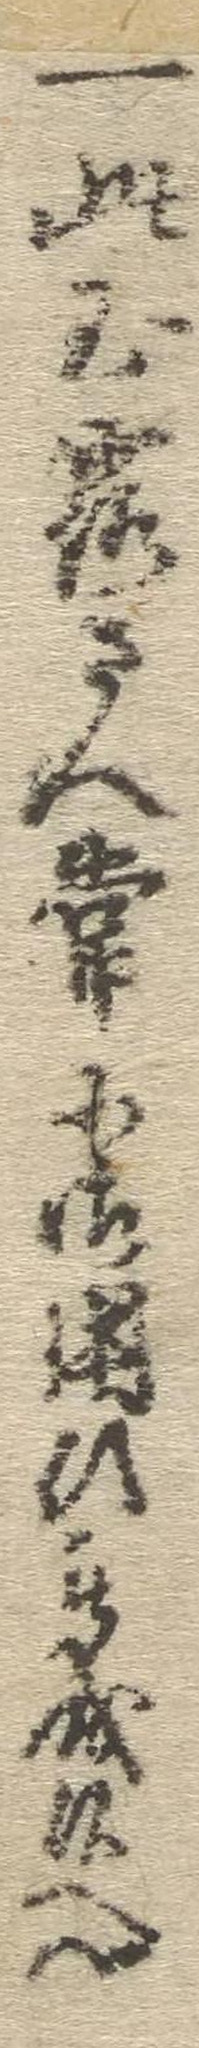一此玉露さん常に御用被成候へば
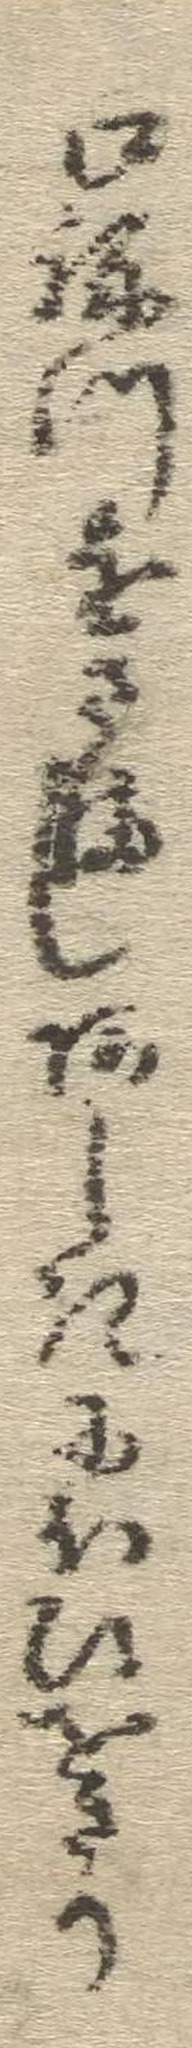口ねつをさましあしきにほひをきり
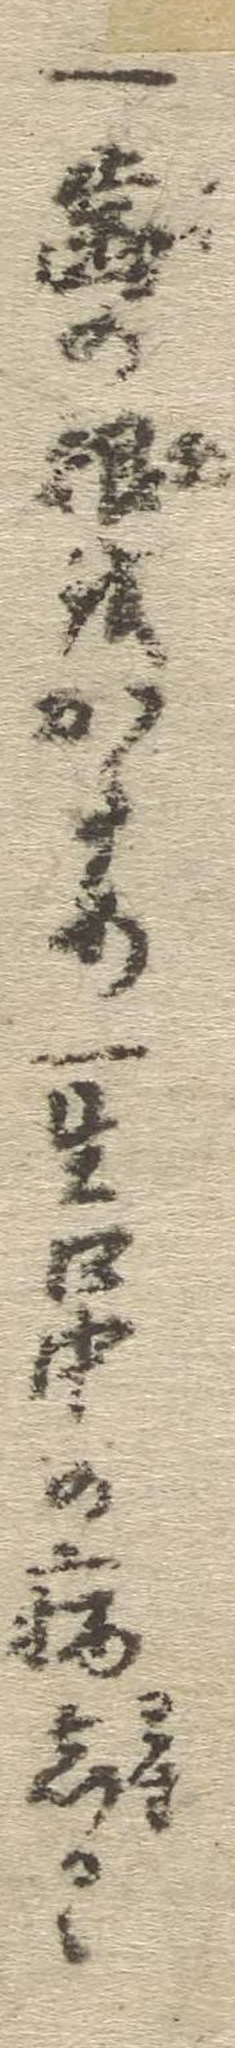一歯の根をかため一生口中の病忘るゝ
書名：浪華薬種問屋能書張交帖. 二
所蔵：国立国会図書館 National Diet Library, JAPAN
